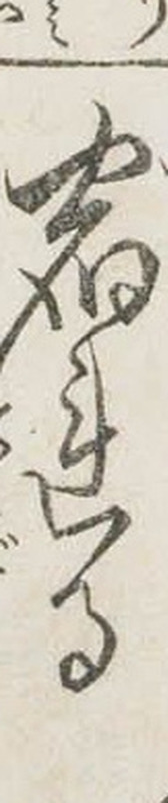宿れる
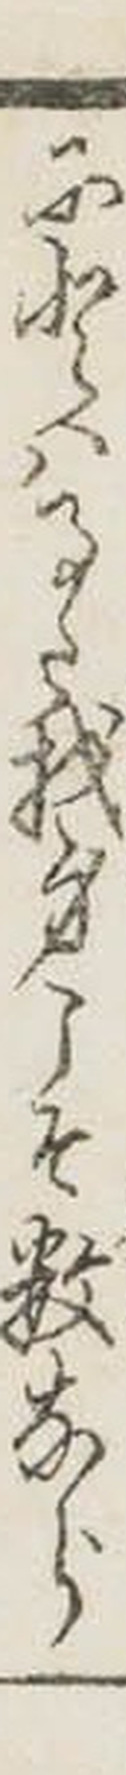にとはるゝ我身こそ数なら
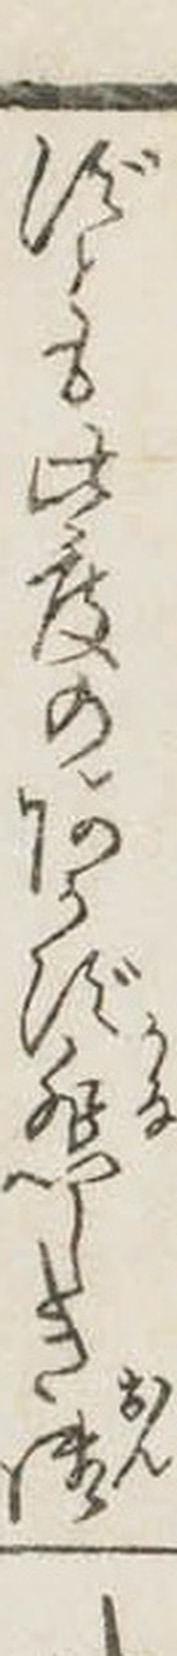ずとも此度のあかず悲しき御
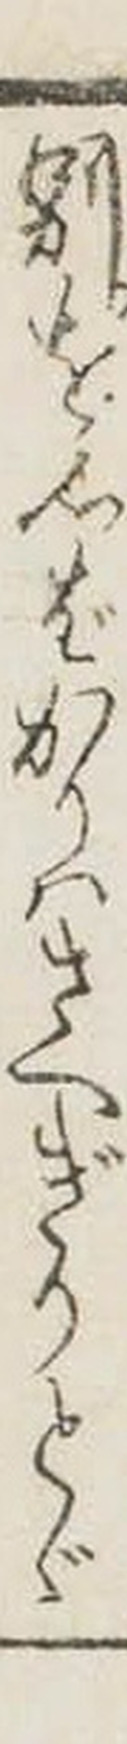別を心ばかりはさへぎりとゞ
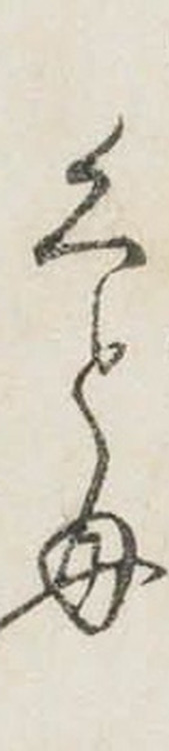くとも
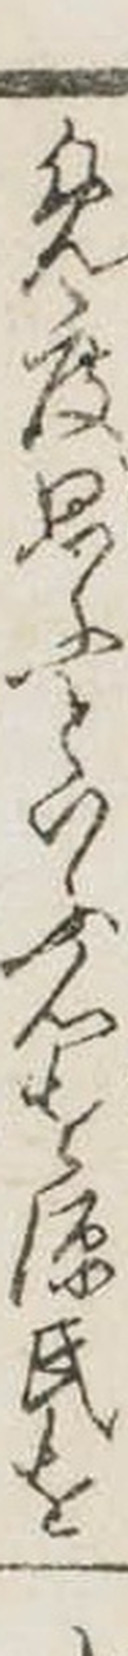め度思ふといふ心を源氏を
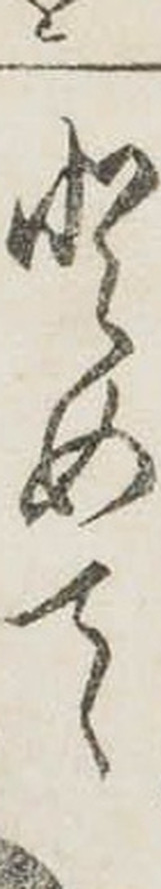とめて
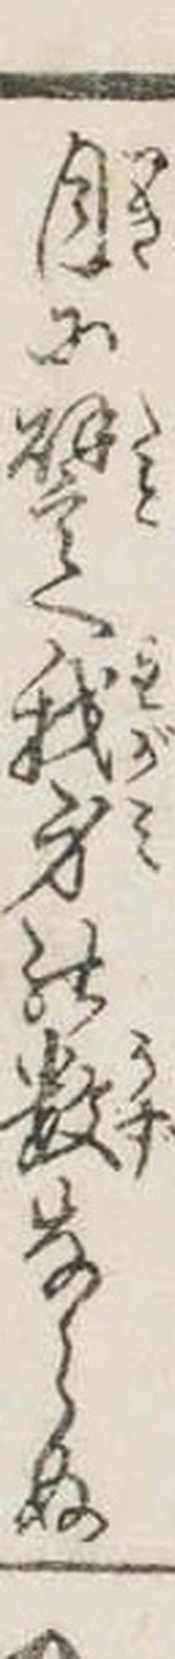月に譬へ我身の数ならぬ
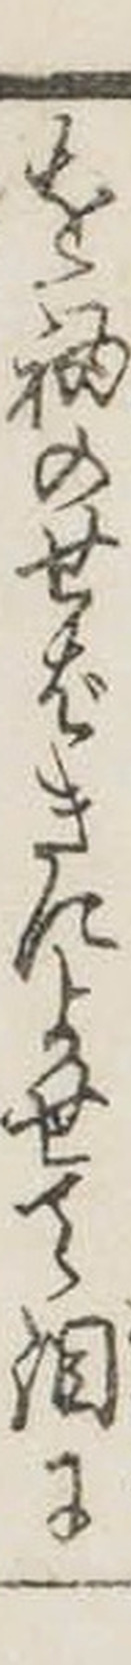を袖のせばきによせて泪に
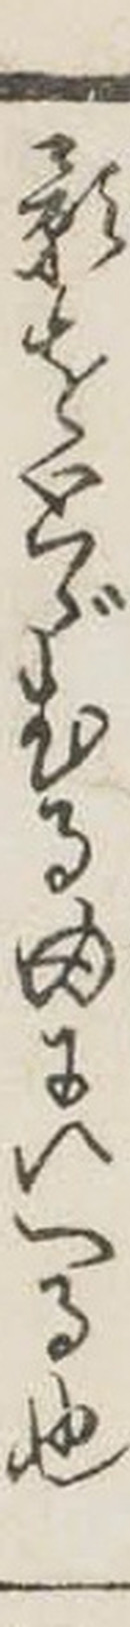影をとゞむる由にいへる也

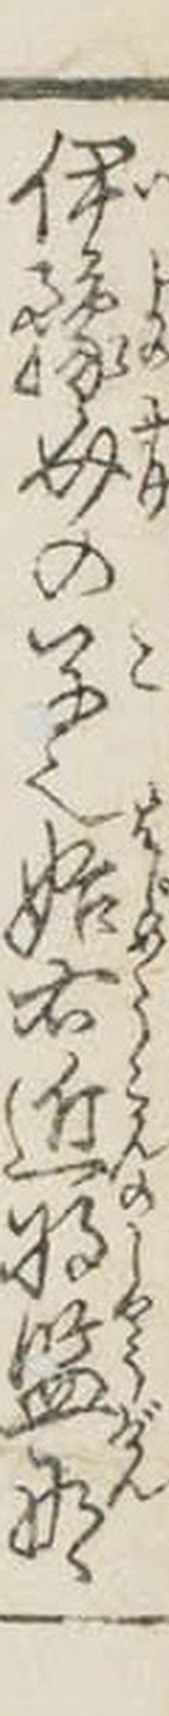伊予介の子也始右近将監な
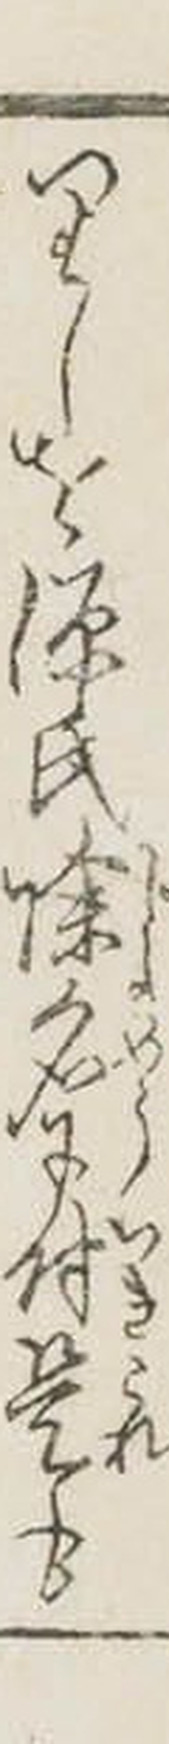りしを源氏除名に付是も
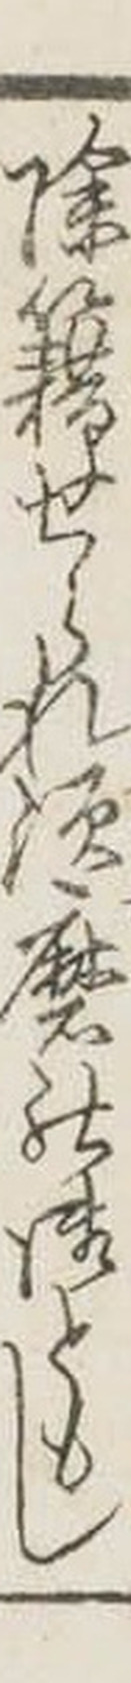除籍せられ須磨の御ともし
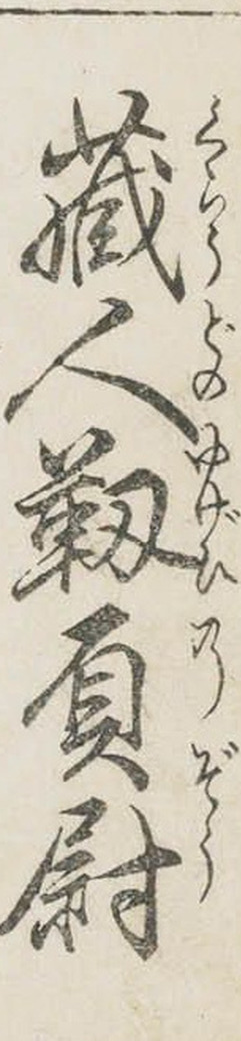蔵人靫負尉
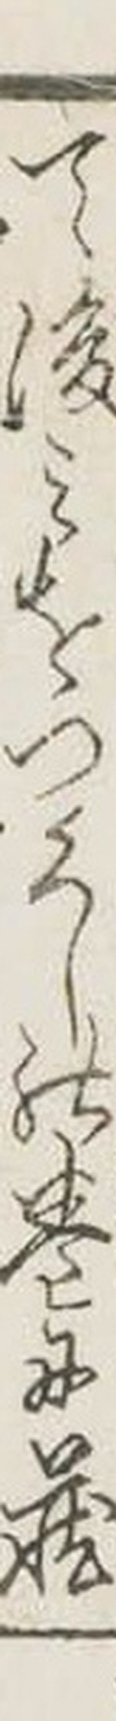て後みをつくしの巻に蔵
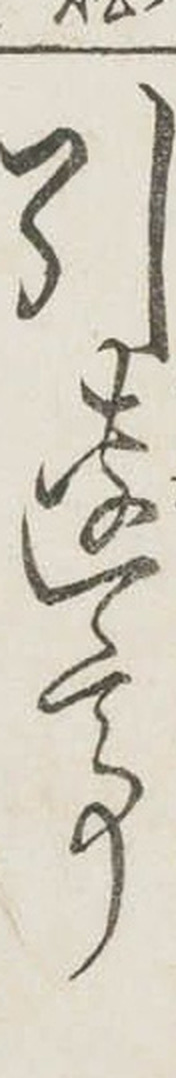引連て
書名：源氏百人一首
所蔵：東京学芸大学教育コンテンツアーカイブ
